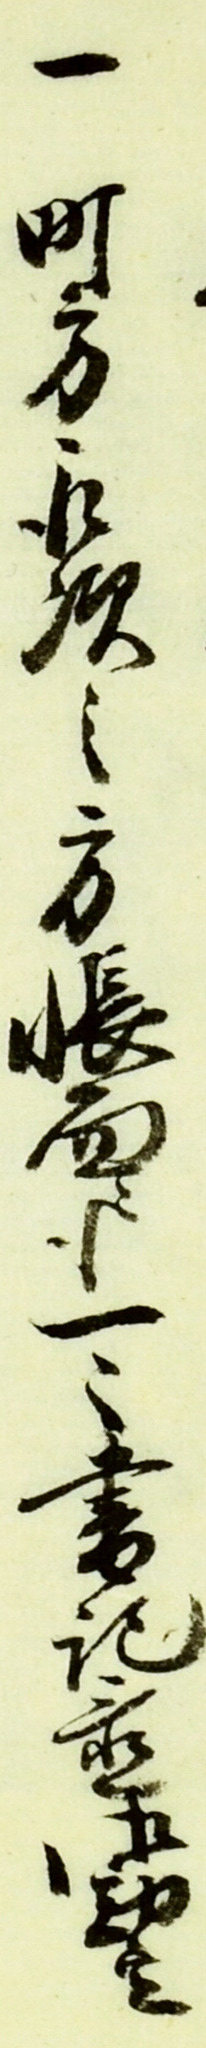一町方取次之方帳面ニも一々書記置御勘定
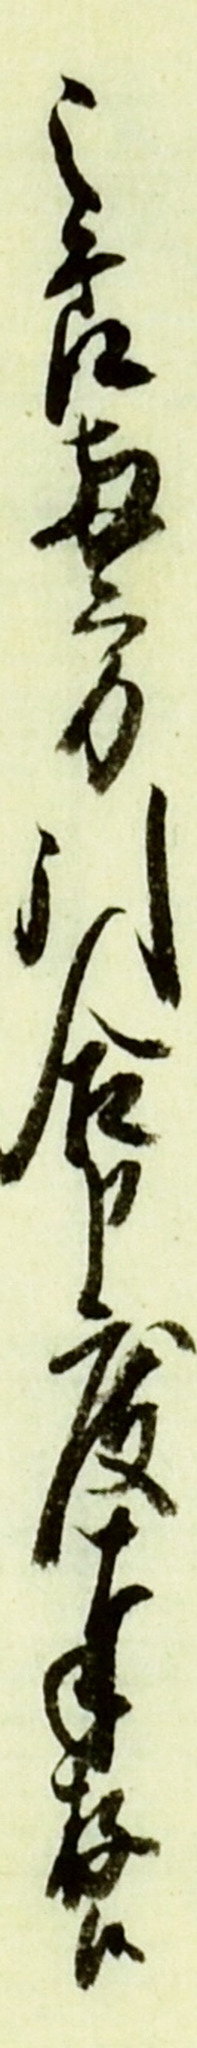之節両方引合申度奉存候
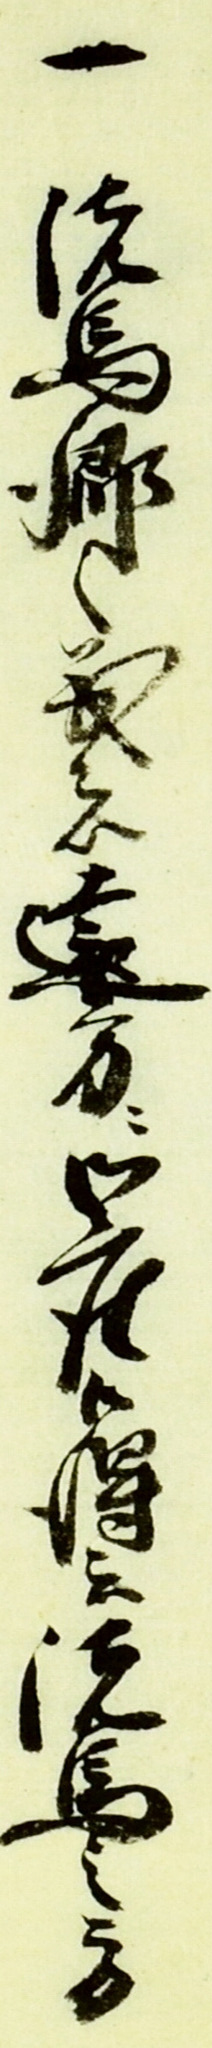一洗馬郷之義者遠方ニ御座候得者洗馬之方
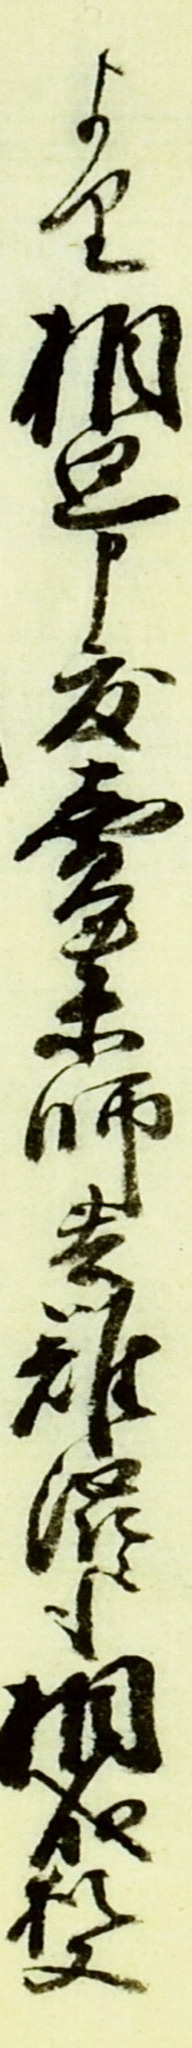より相廻申度売薬師者難渋も相成猶又
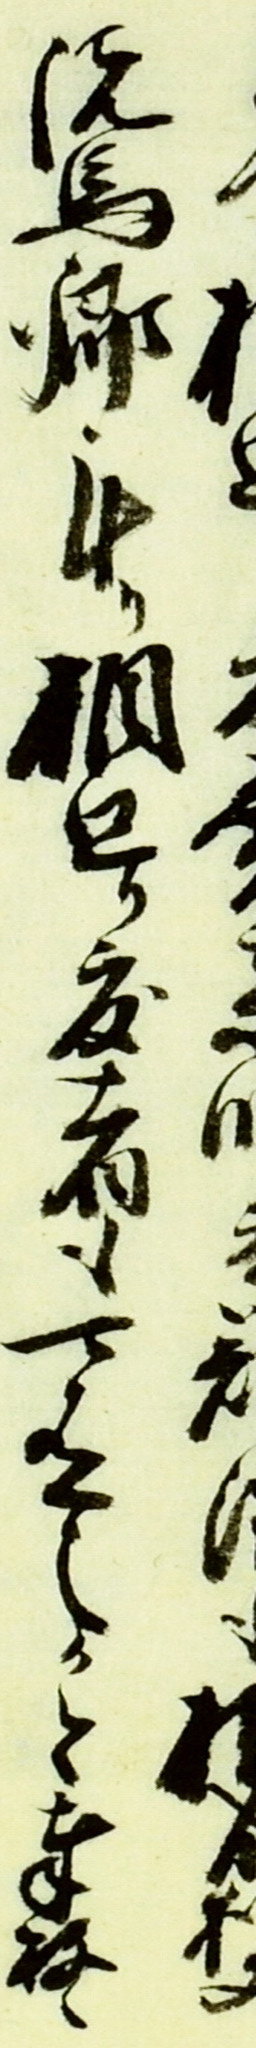洗馬郷計り相廻り度者も可有之かと奉存候
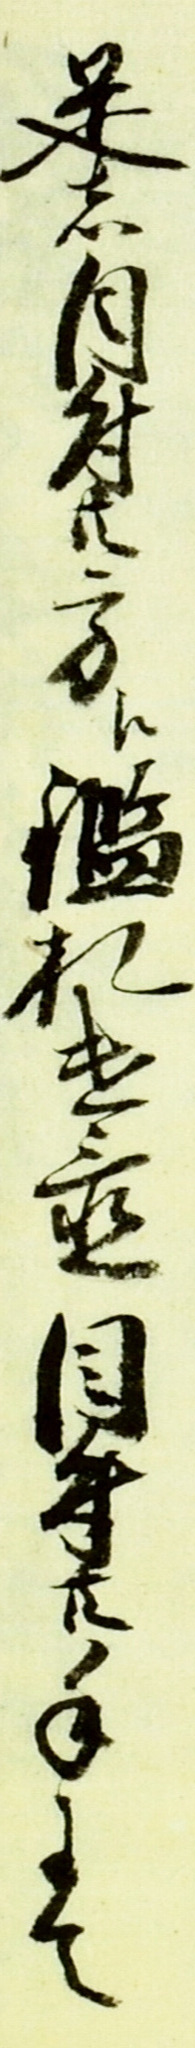是者目付共方江鑑札遣置目付共手にて
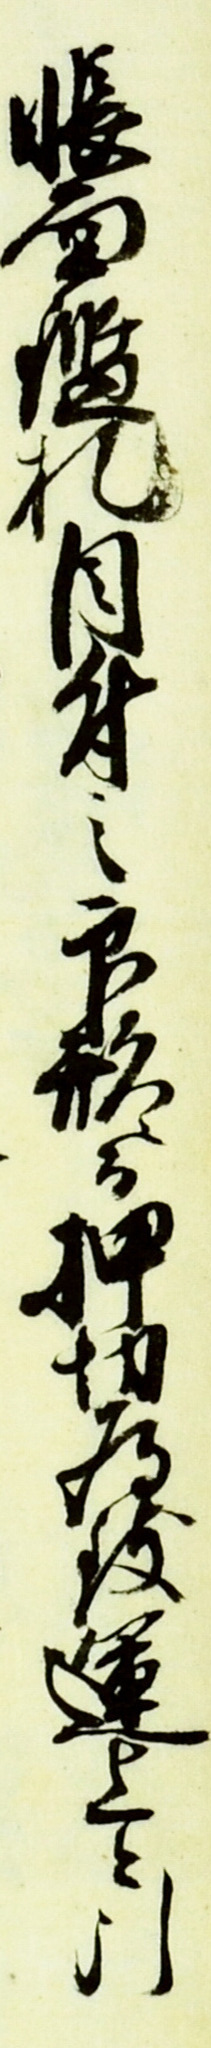帳面鑑札目付之印形ニ而押切為致運上と引
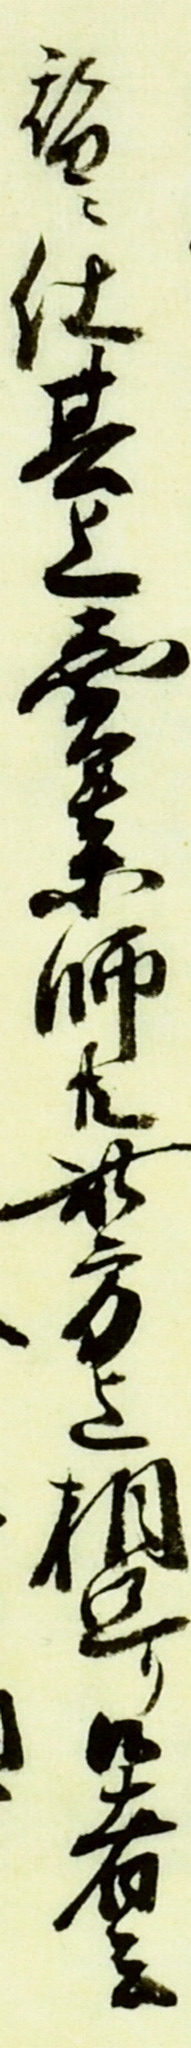替ニ仕其上売薬師共此方迄相廻り候者者
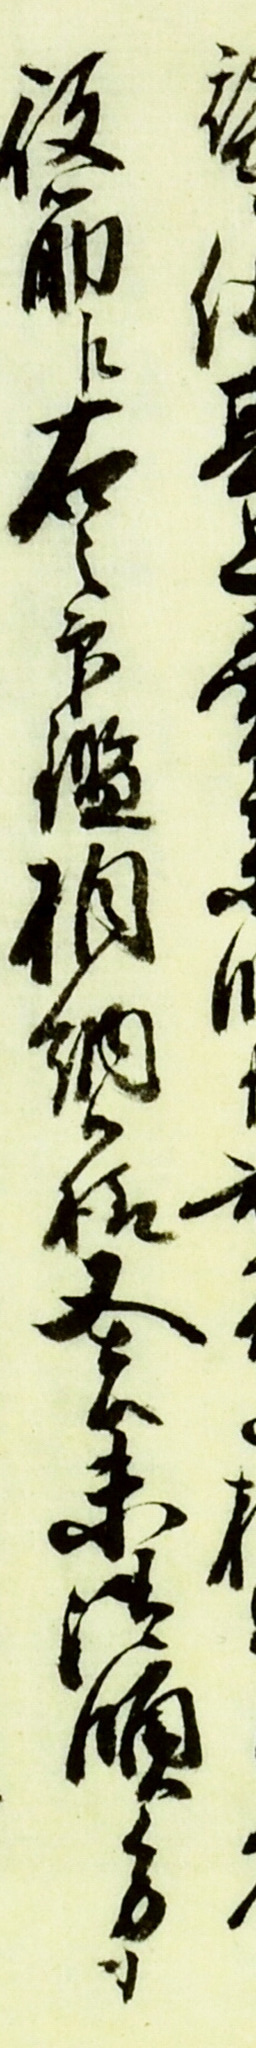役筋江右之印鑑相納候様又者未御領分も
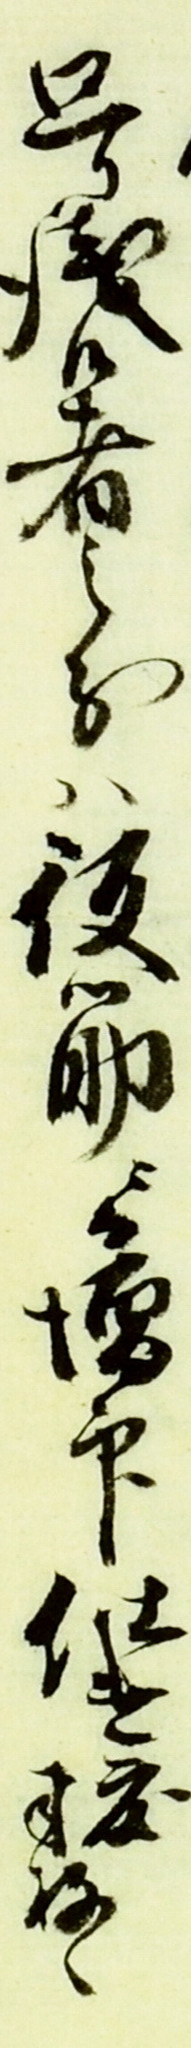廻り銭候者之分ハ役筋ニ而増印仕遣度奉存候
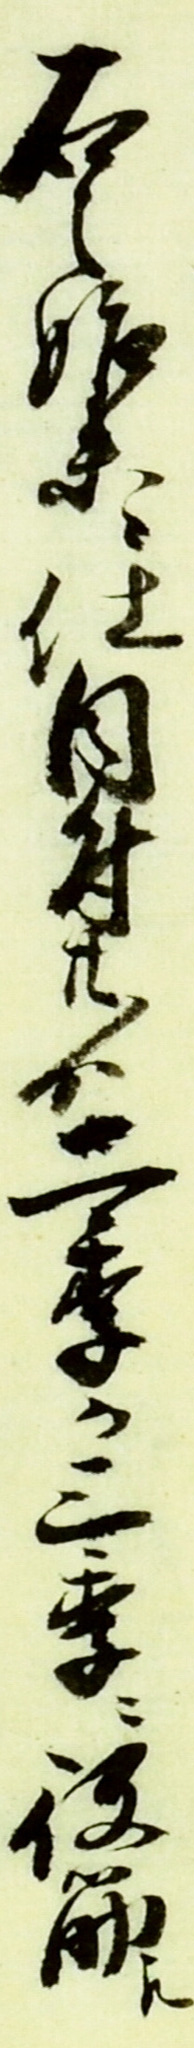右之始末ニ仕目付共ゟ二季か三季ニ役筋江
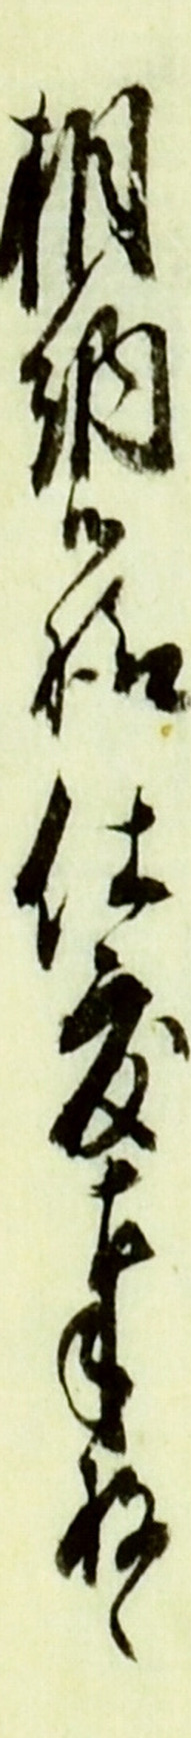相納候様仕度奉存候
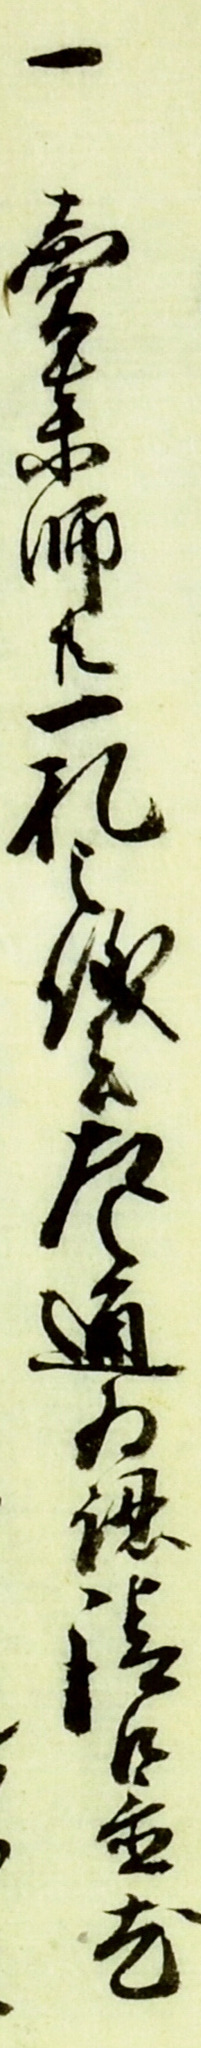一売薬師共一札之儀者左之通為認請候置尤
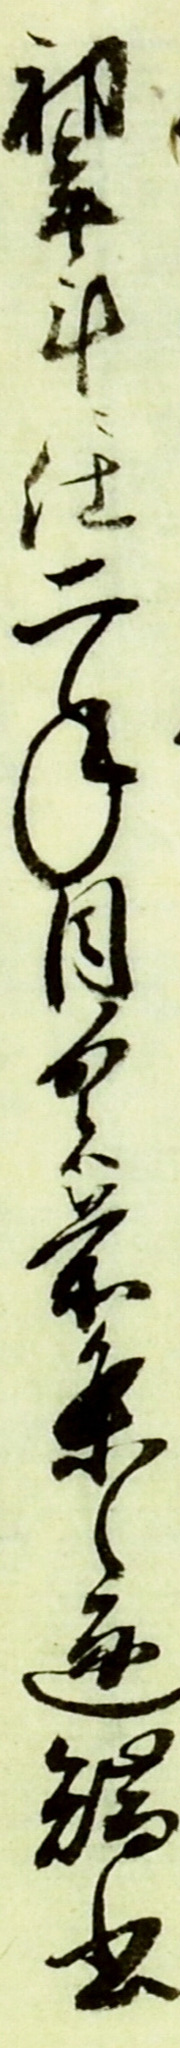初年計ニ仕二年目ゟ者前条之通端書
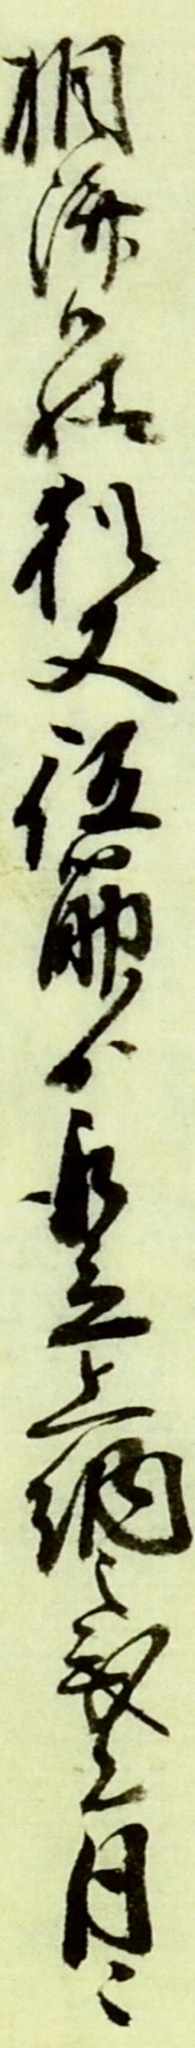相済候様猶又役筋ゟ取立上納之義者月々
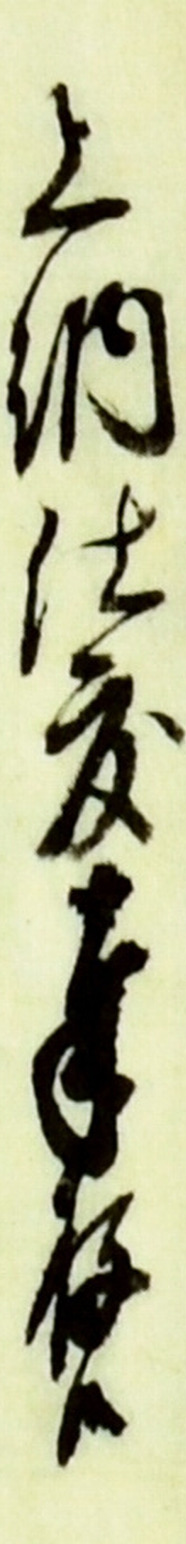上納仕度奉存候
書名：他国賣薬師運上之事
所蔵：伊那市立高遠町図書館・合同会社AMANE
